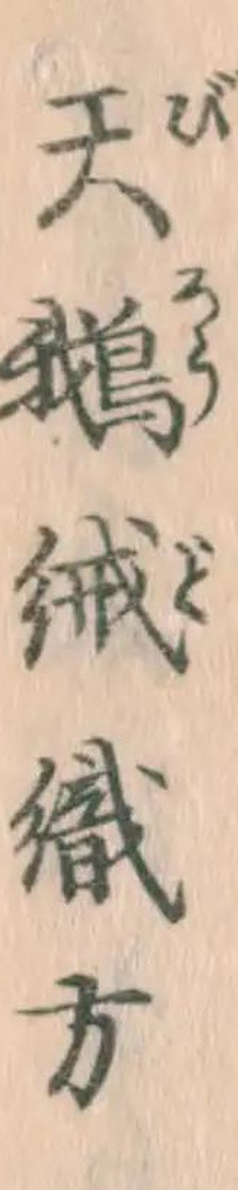天鵝絨織方
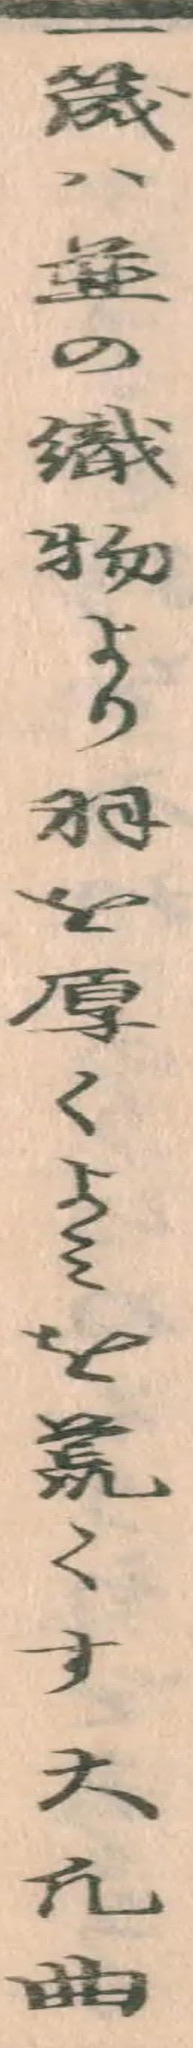一筬は並の織物より羽を厚くよみを荒くす大凡曲
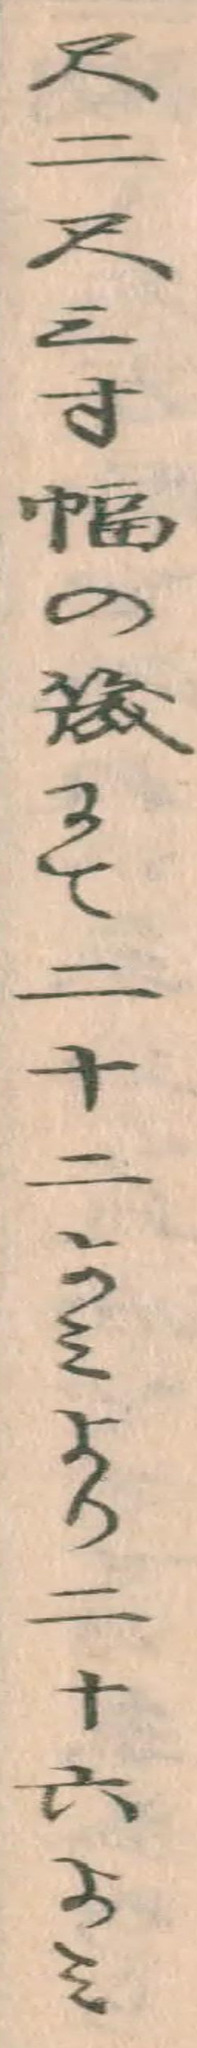尺二尺三寸幅の筬にて二十二よみより二十六よみ
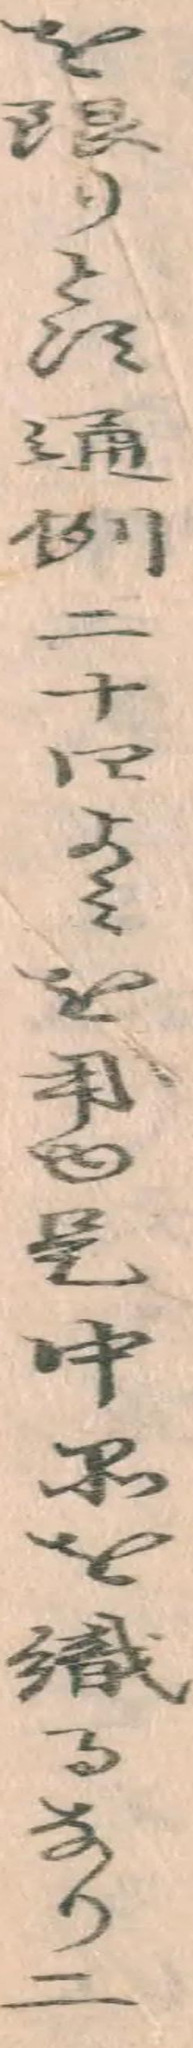を限りとす通例二十四よみを用ゆ是中品を織るなり二
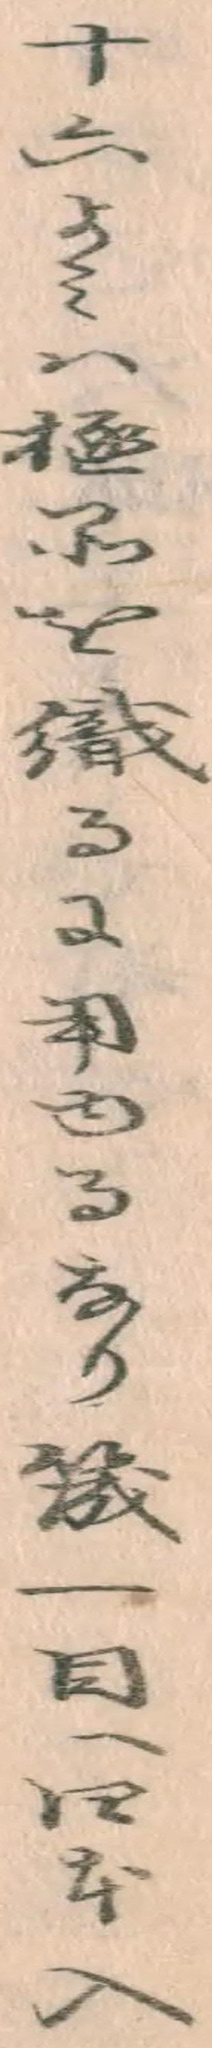十六よみは極品を織るに用ゆるなり筬一目へ四本入
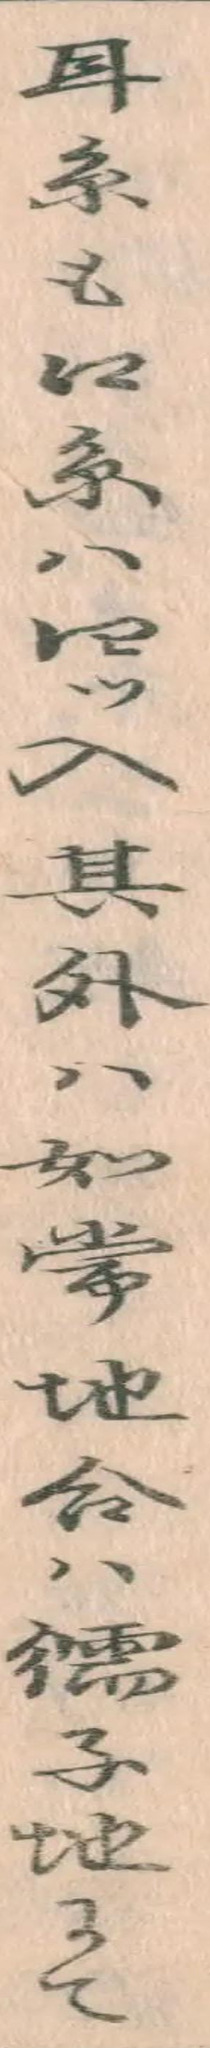耳糸も口糸は四ッ入其外は如常地合は繻子地にて
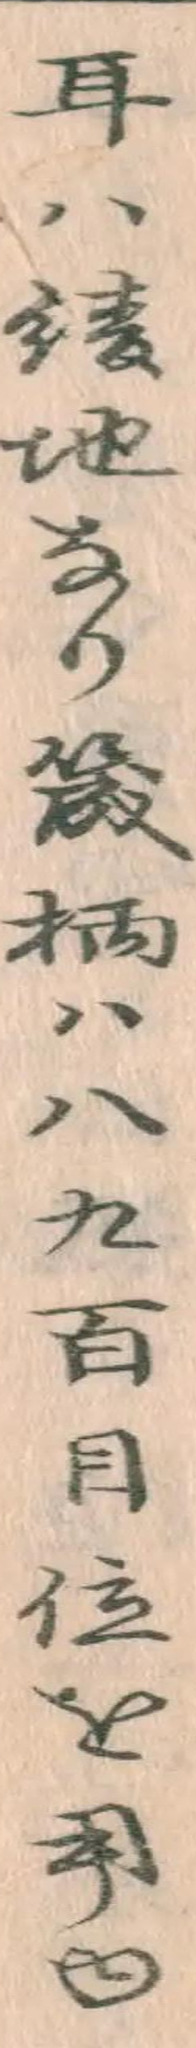耳は綾地なり筬柄は八九百目位を用ゆ
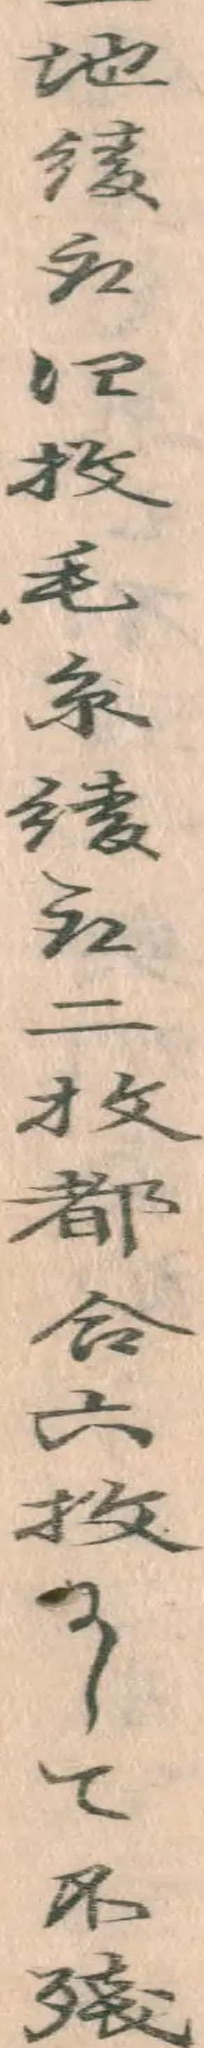一地綾取四枚毛糸綾取二枚都合六枚にして不残
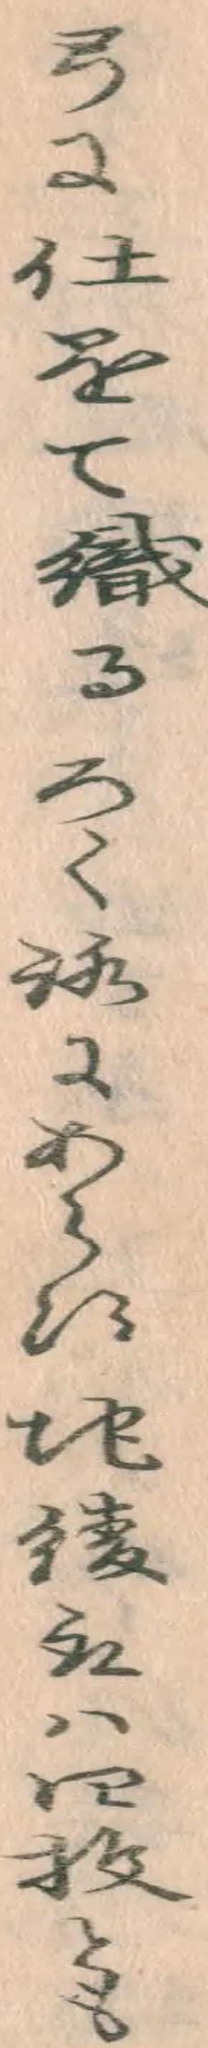弓に仕懸て織るろくろにあらす地綾取は四枚とも
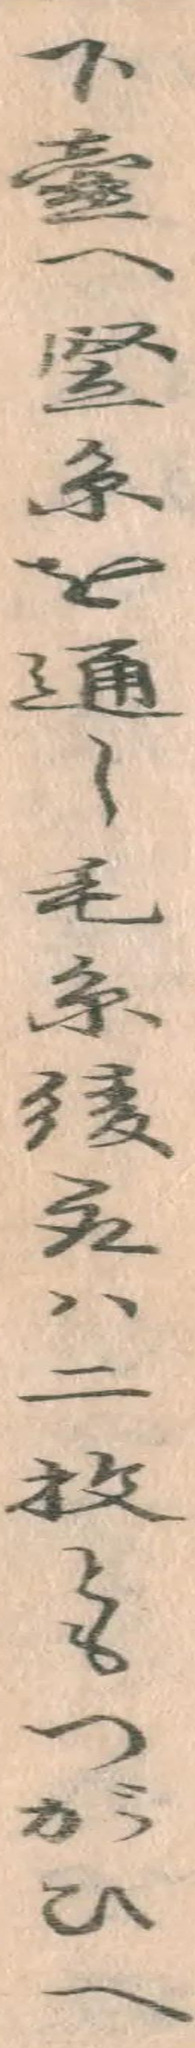下壺へ竪糸を通し毛糸綾取は二枚ともつがひへ
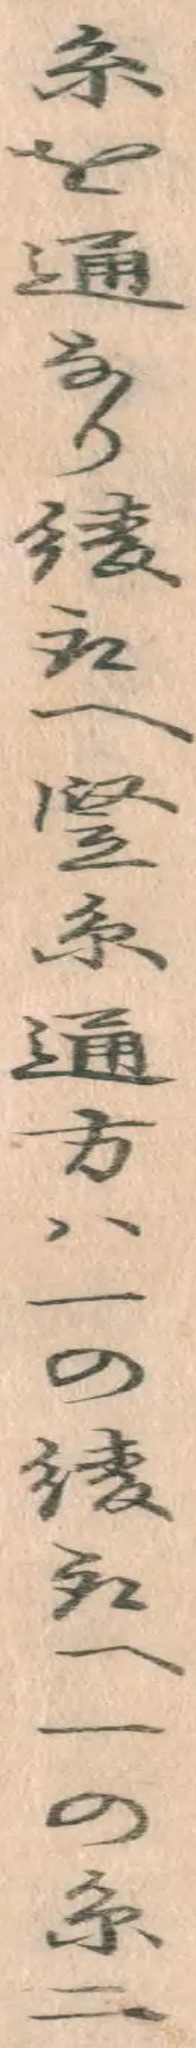糸を通なり綾取へ竪糸通方は一の綾取へ一の糸二
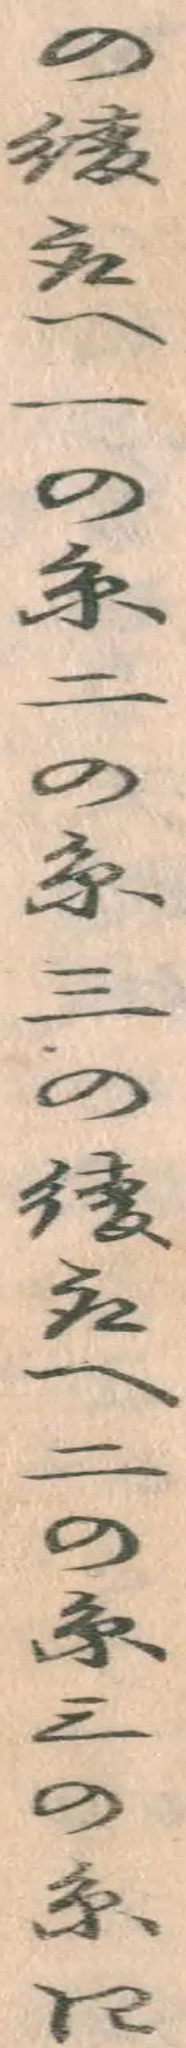の綾取へ一の糸二の糸三の綾取へ二の糸三の糸四
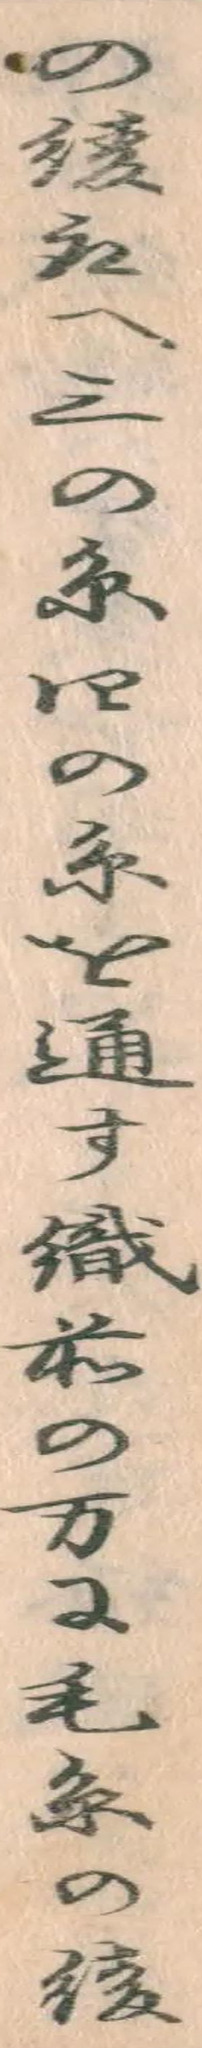の綾取へ三の糸四の糸を通す織前の方に毛糸の綾
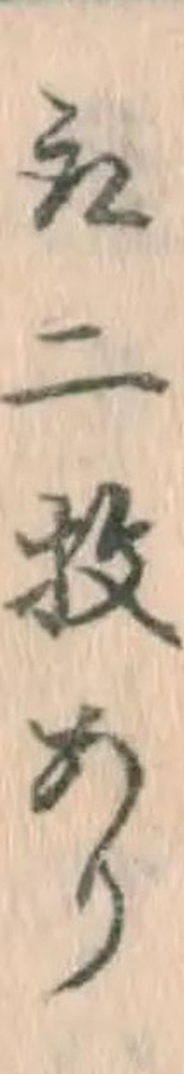取二枚あり
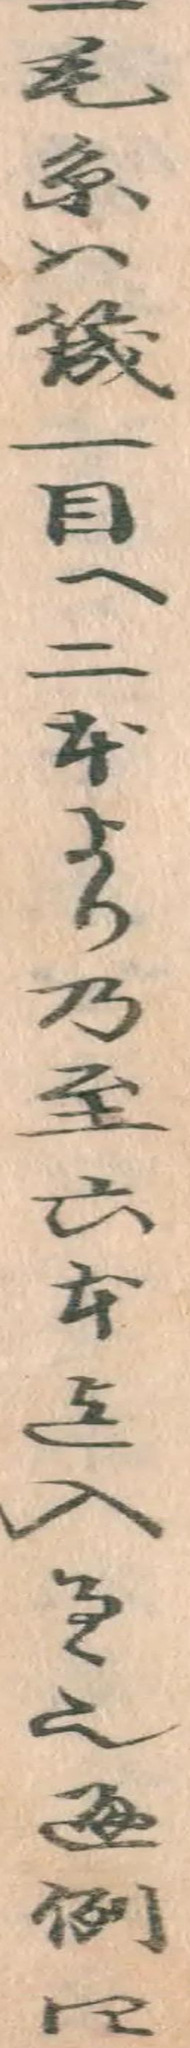一毛糸は筬一目へ二本より乃至六本迄入るゝ也通例四
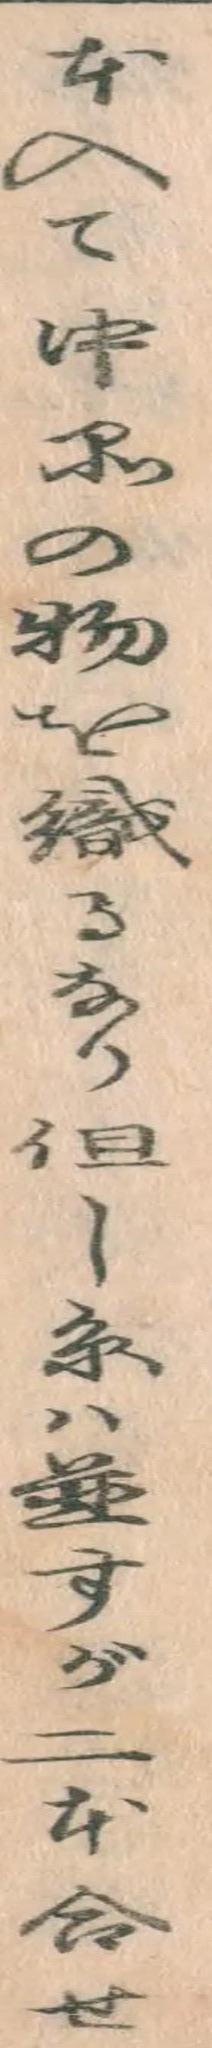本入て中品の物を織るなり但し糸は並すが二本合せ
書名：機織彙編 5巻. [2]
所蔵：国立国会図書館 National Diet Library, JAPAN
